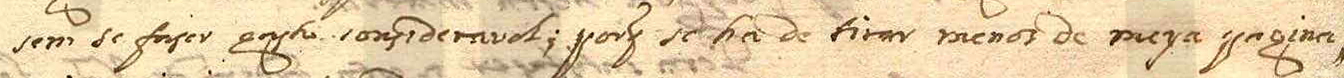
sem se faser gasto consideravel; porq̄ se ha de tirar menos de meya pagina,
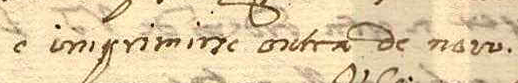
e imprimirse outra de novo.
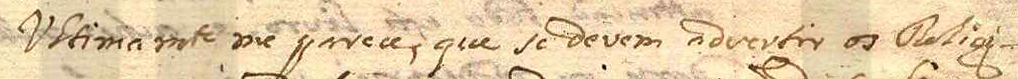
Vltimamte me parece, que se devem advertir os Religi
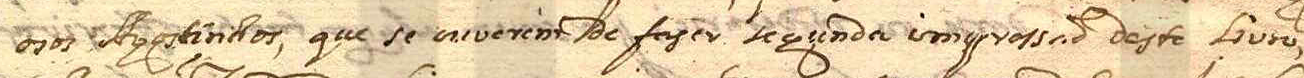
osos Agostindos, que se ouverem de faser segunda impressaõ deste Livro,
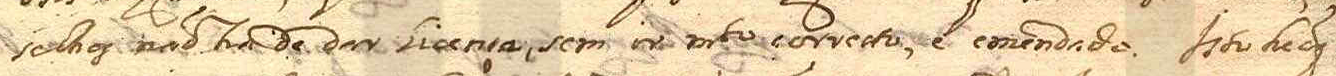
se lhes naõ ha de dar licença, sem ir mto correcto, e emendado. Isto he o q̄
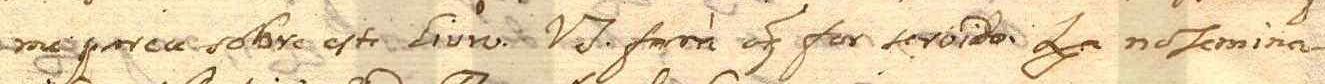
me parece sobre este livro. VS. farà o q̄ for servido. Lxa no semina
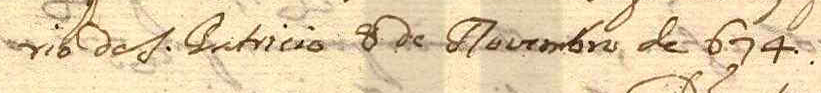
rio de S. Patricio 8 de Novembro de 674.
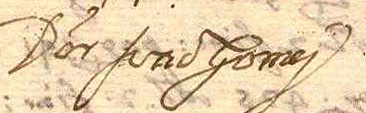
Dōr Joaõ Gomez
